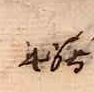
465
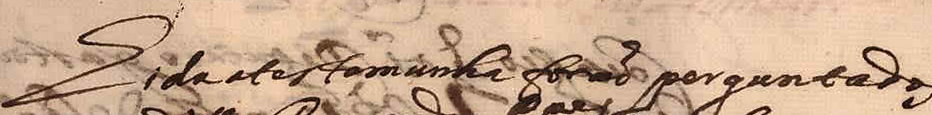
E ida a testemunha foraõ perguntados
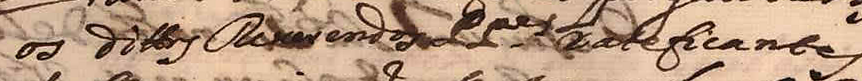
os dittos Reuerendos PP.es rateficantes
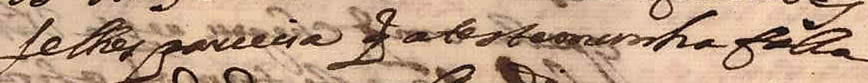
se lhes parecia q̄ a testemunha falla
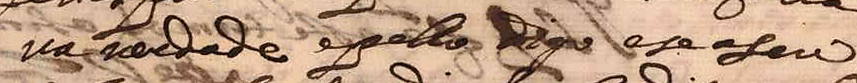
ua uerdade e pello digo e se a seu
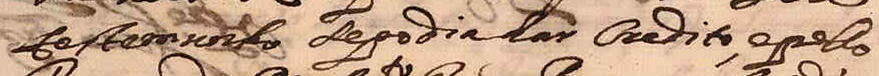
testemunho se podia dar Credito, e pello
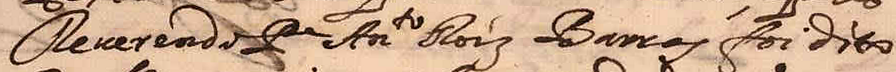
Reuerendo Pe Anto Roiz̄ Barros foi dito
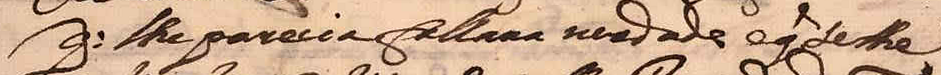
q̄ lhe parecia fallaua uerdade e q̄ se lhe
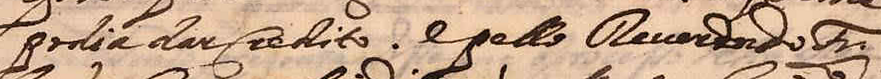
podia dar Credito. e pello Reuerendo Fr.
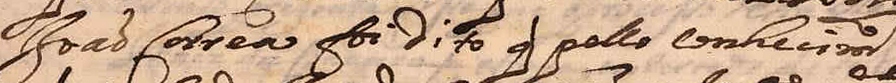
Joaõ Correa foi dito q̄ pello conhecimto
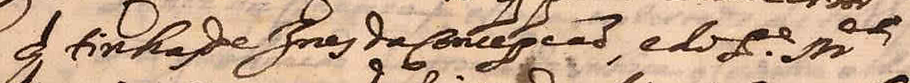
q̄ tinha de Jnes da Concepçaõ, e do P.e Mel
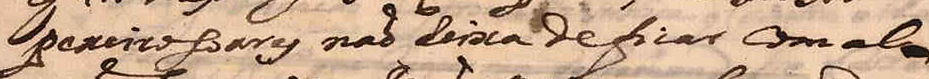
pexeiro soares naõ deixa de ficar com al
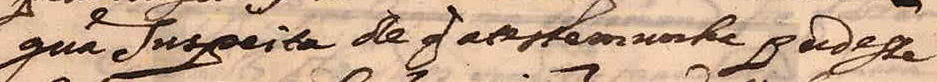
guā suspeita, de q̄ a testemunha pudesse
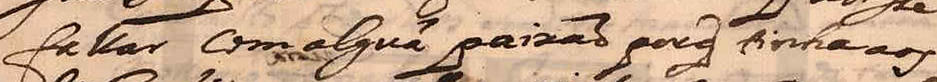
fallar com alguā paixaõ porq̄ tinha aos
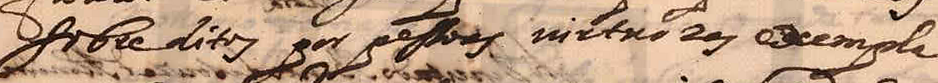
sobreditos por pessoas uirtuozas exempla
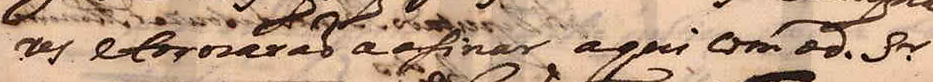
res e tornaraõ a asinar aqui com o d. S.r
